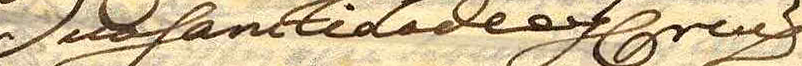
Sua sanctidade o esCreuj
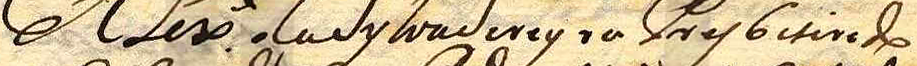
Alex.e da Sylva Pereyra Presbitero do
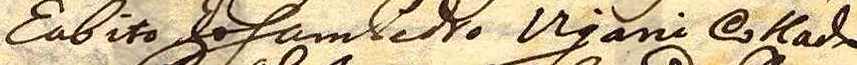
habito do sam Pedro Vigario Collado
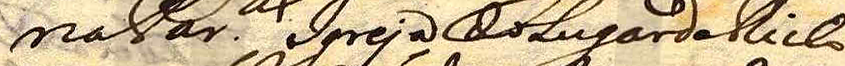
na Par.al Igreja do Lugar do Richo
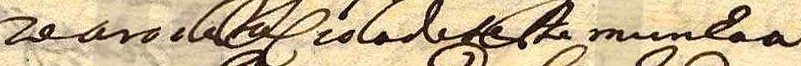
zo arc desta Cidade testemunha a
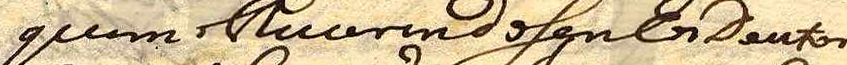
quem o Reuerendo o senhor Doutor
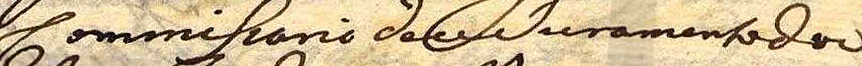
Commissario deu o Iuramento dos
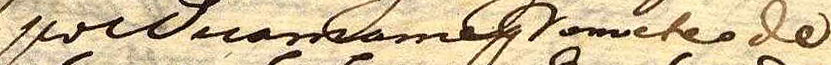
pos Sua mam e prometeo de
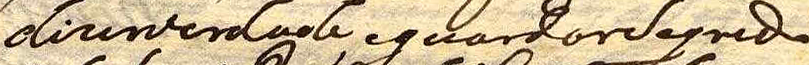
dizer verdade, e guardar segredo
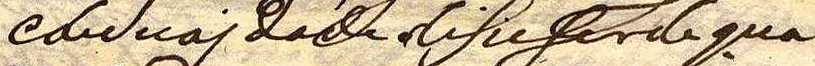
e de sua jdade disse ser de qua
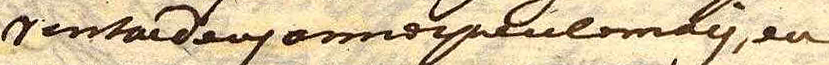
renta e dous annos pouco mais, ou
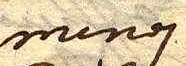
menos
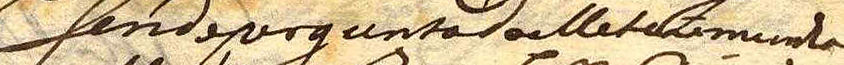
E sendo perguntado elle testemunha
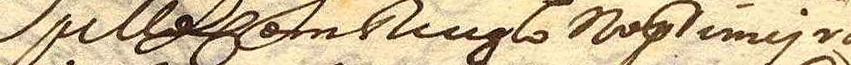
pello Comtheudo No primejro
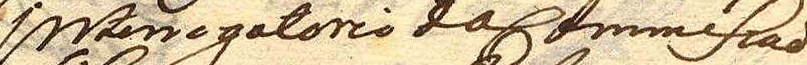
jnterrogatorio da Commissaõ
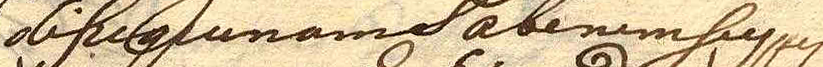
disse que nam Sabe nem suspej
